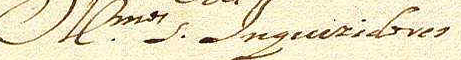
Ill.mos s. Inquizidores
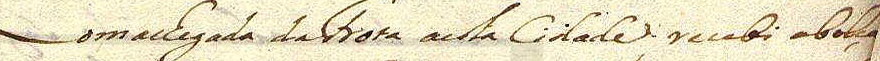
Com a chegada da Frota a esta Cidade, recebi a bolça
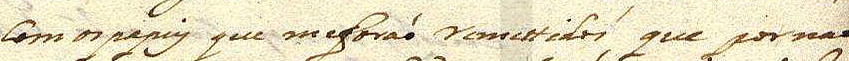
Com os papeis que me foraõ remettidos, que por naõ
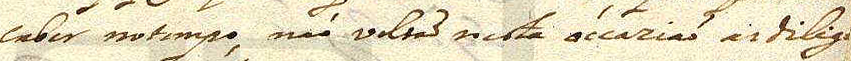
caber no tempo, naõ valem nesta occaziaõ as dilig
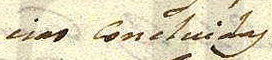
cias concluidas.
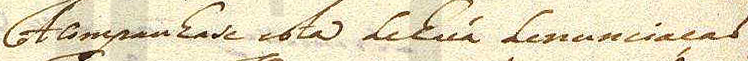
Acompanhase esta de huā denunciaçaõ
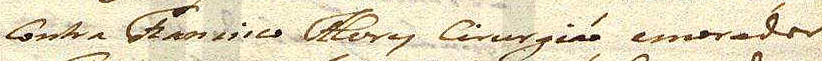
Contra Francisco Alvres Cirurgiaõ, e morador
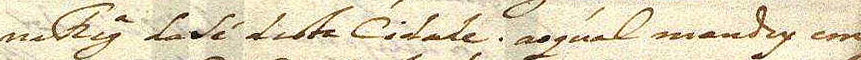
na Freg.a da Sé desta Cidade. no qual mandey em
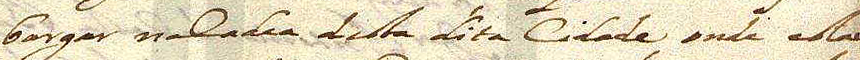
bargar na Cadea desta dita Cidade, onde estou
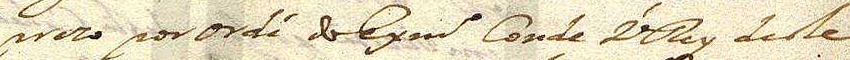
prezo por ordé do Exm.o Conde V Rey deste
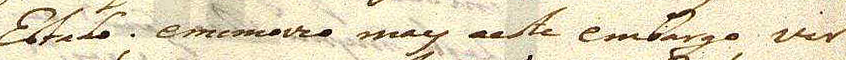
Estado; e me moveo maes a este embargo, vir
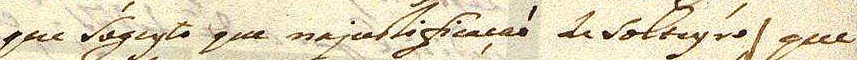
que sogeyto que na justificaçaõ de solteyro,/ que
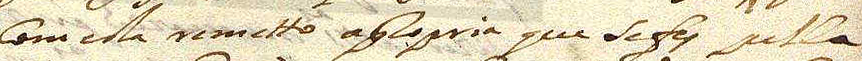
Com esta remetto a propria que se fes pella
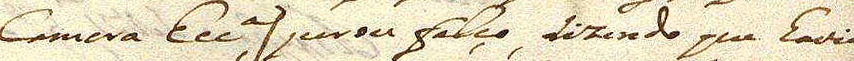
Camera Ecca,/ jurou falço, dizendo que havia
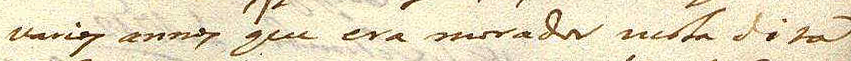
varios annos que era morador nesta dita
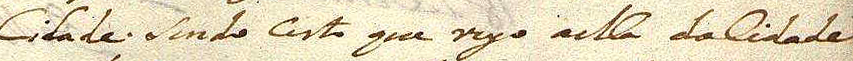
Cidade; sendo certo que veyo a ella da Cidade
